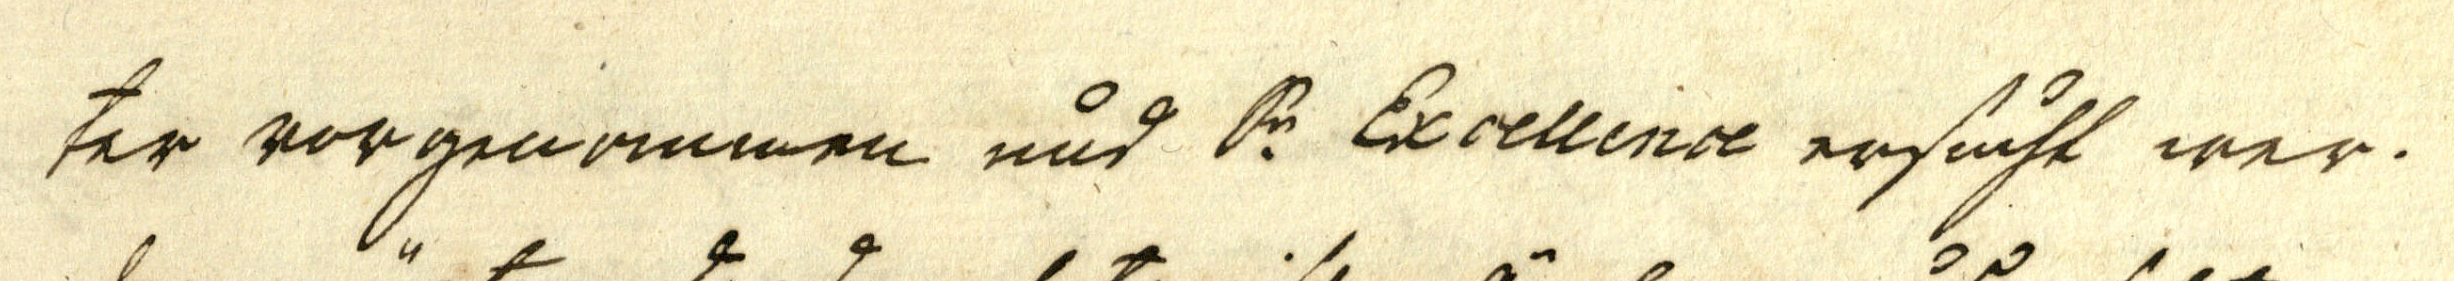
ter vorgenommen und Sr. Excellence ersucht wer¬
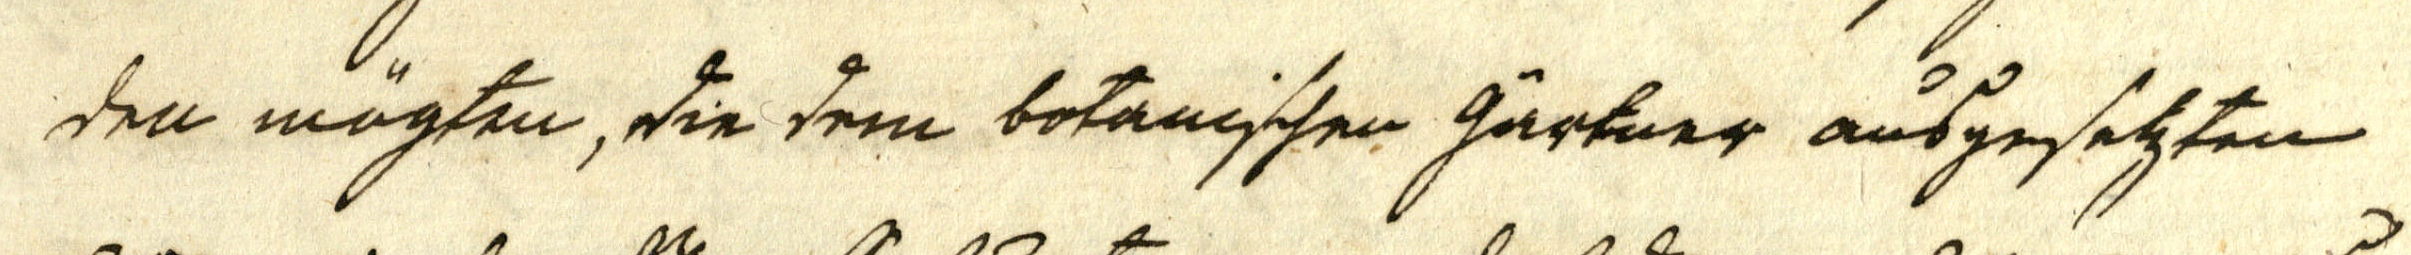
den mögten, die dem botanischen Gärtner ausgesetzten
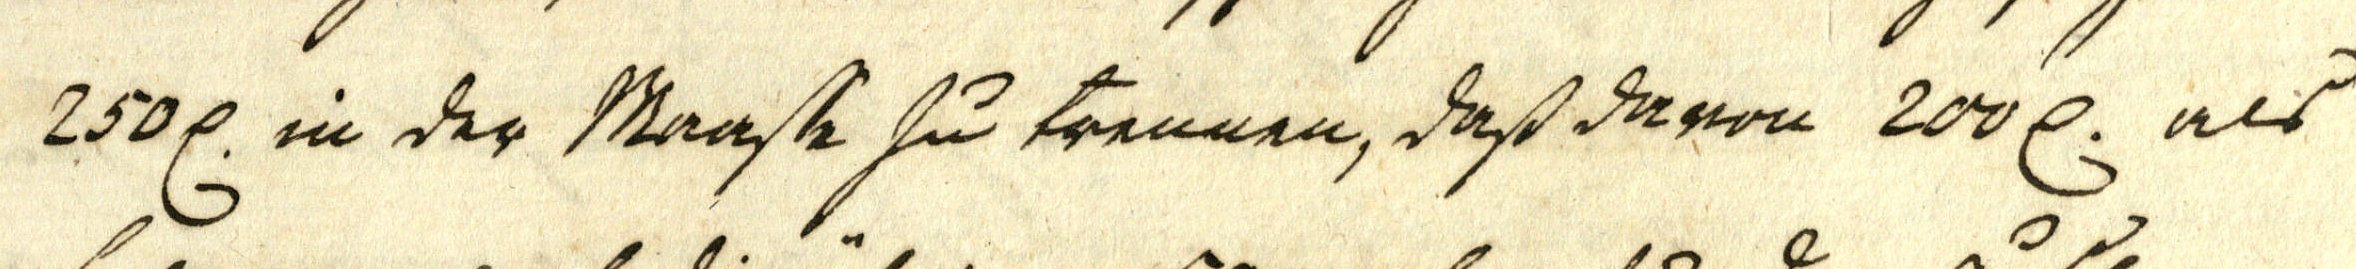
250 l. in der Maasse zu trennen, daß davon 200 l. als
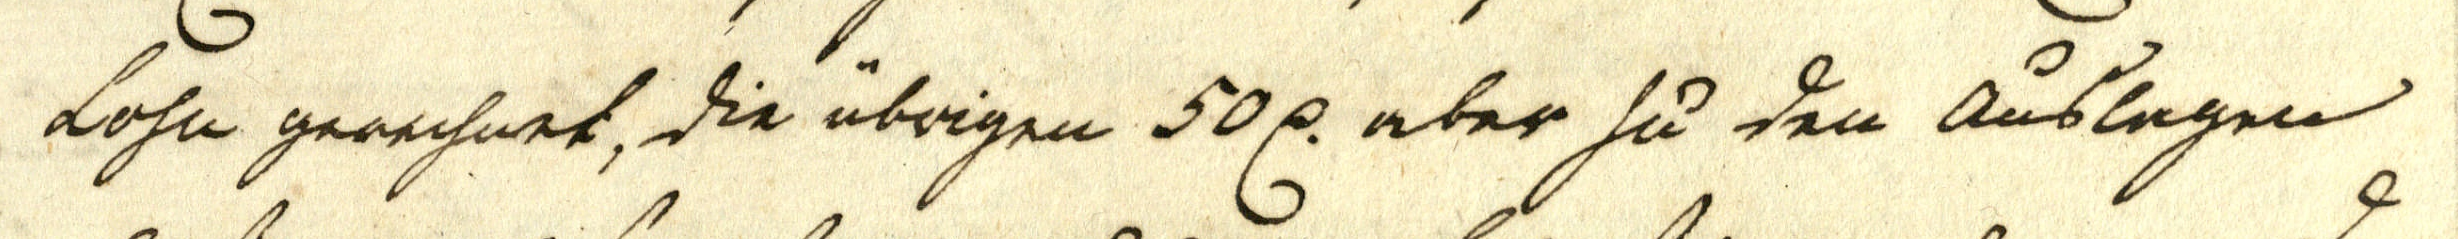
Lohn gerechnet, die übrigen 50 l. aber zu den Auslagen
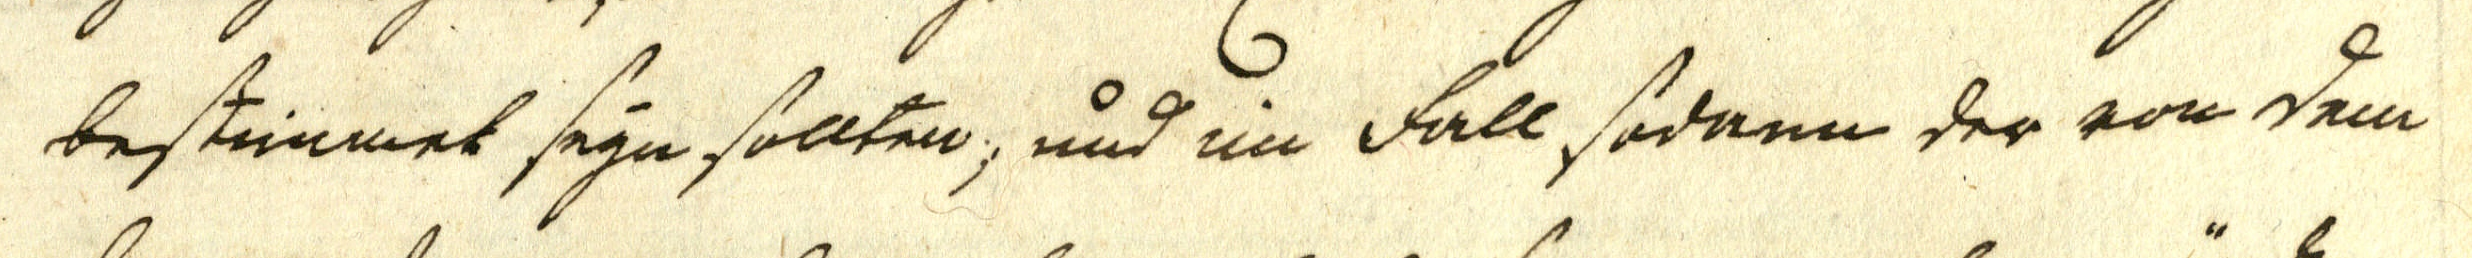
bestimmet seÿn sollten, und im Fall sodann der von dem
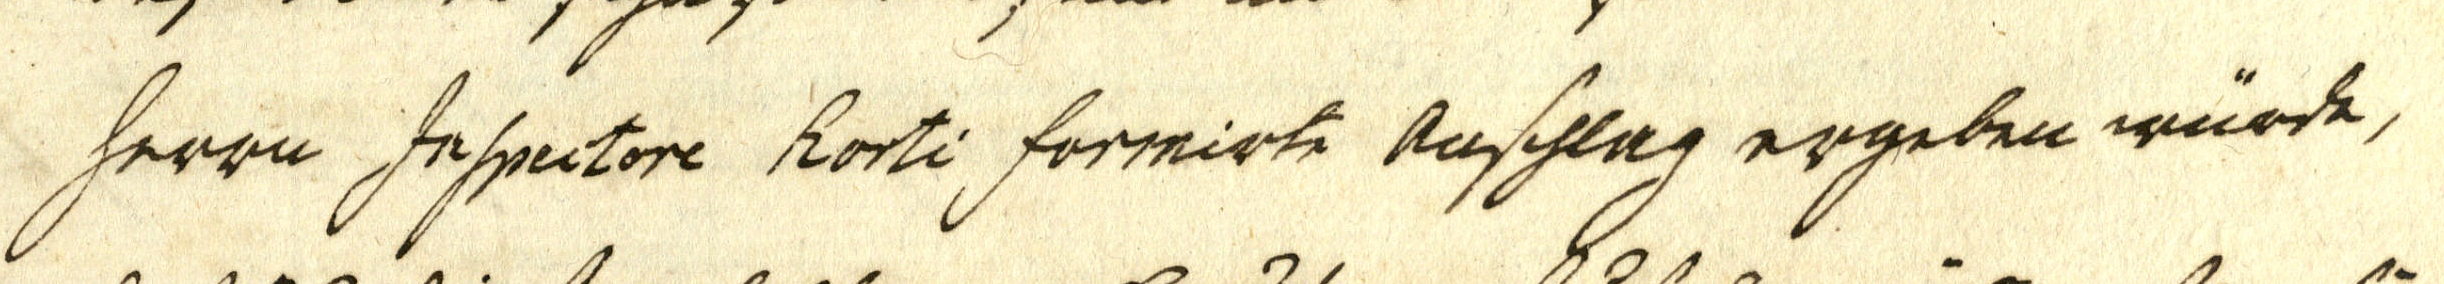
Herrn Inspectore horti formirte Anschlag ergeben würde,
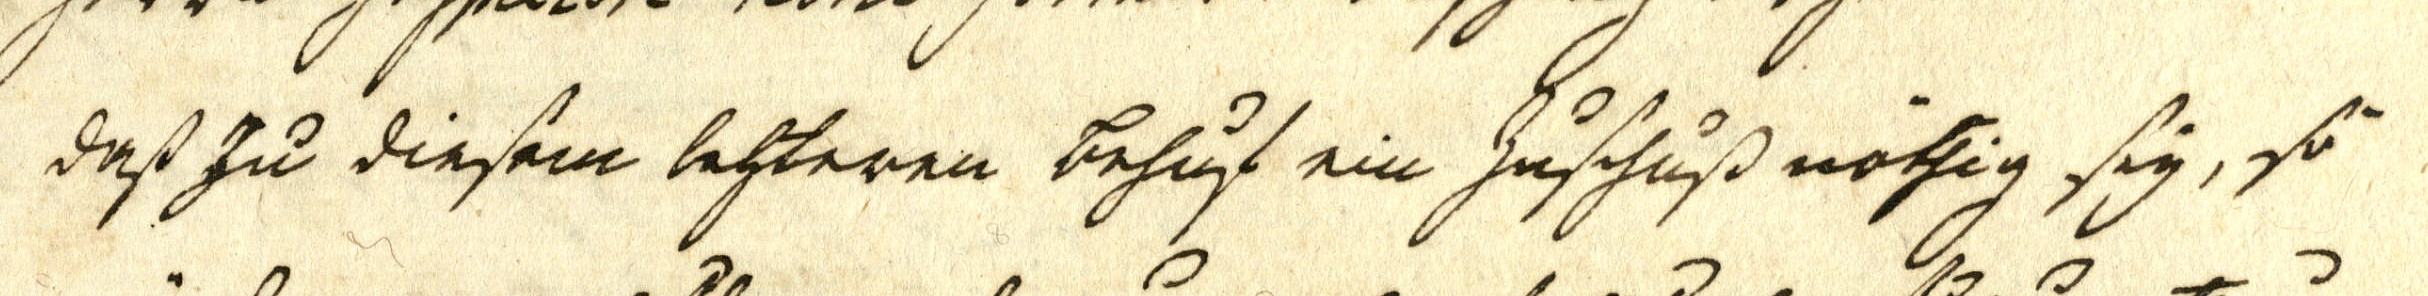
daß zu diesem letzteren Behuf ein Zuschuß nöthig seÿ, so
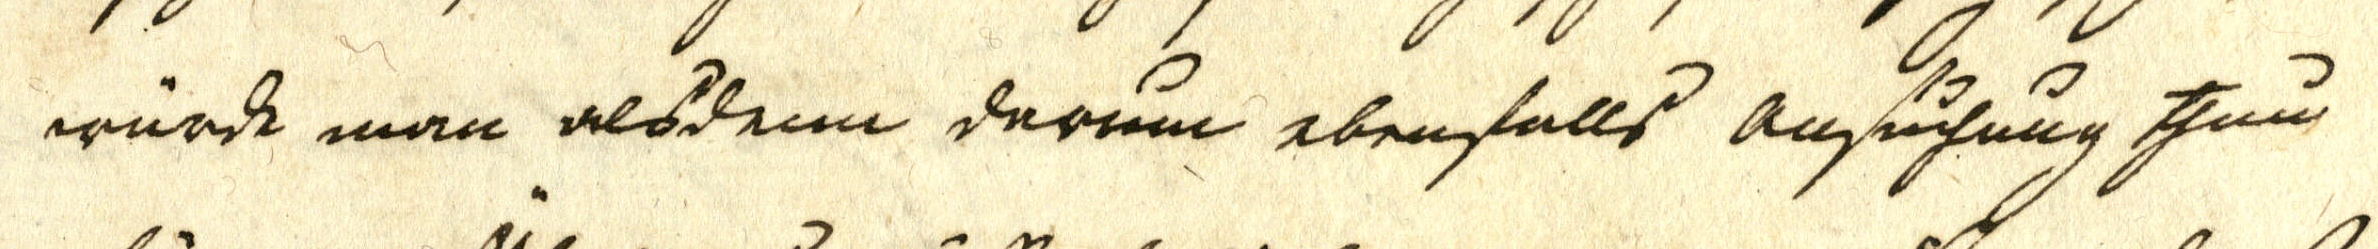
würde man alsdenn darum ebenfalls Ansuchung thun
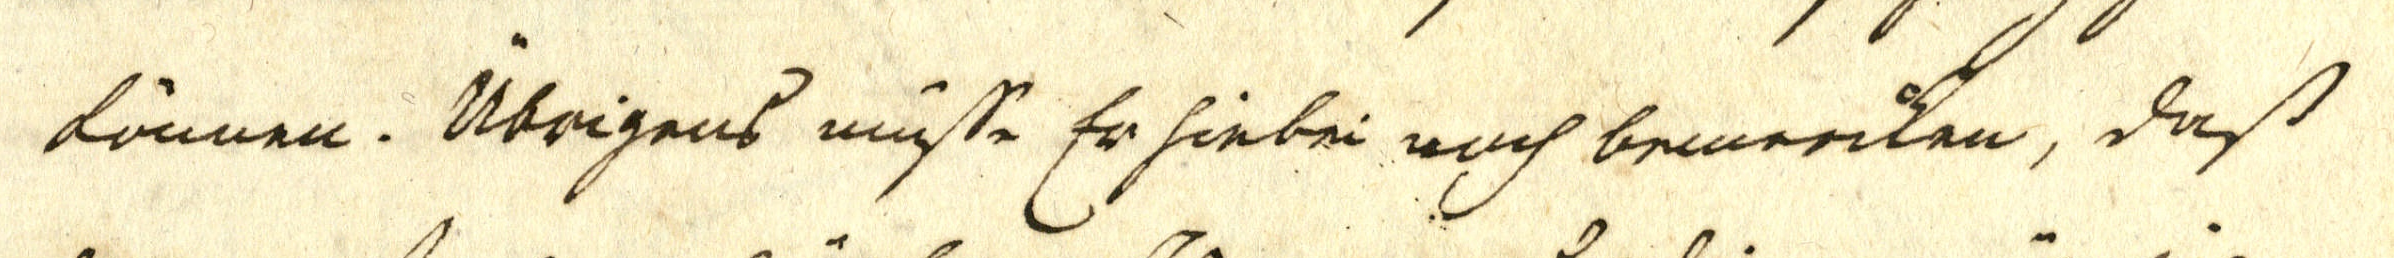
können. Übrigens müsse Er hiebei noch bemercken, daß
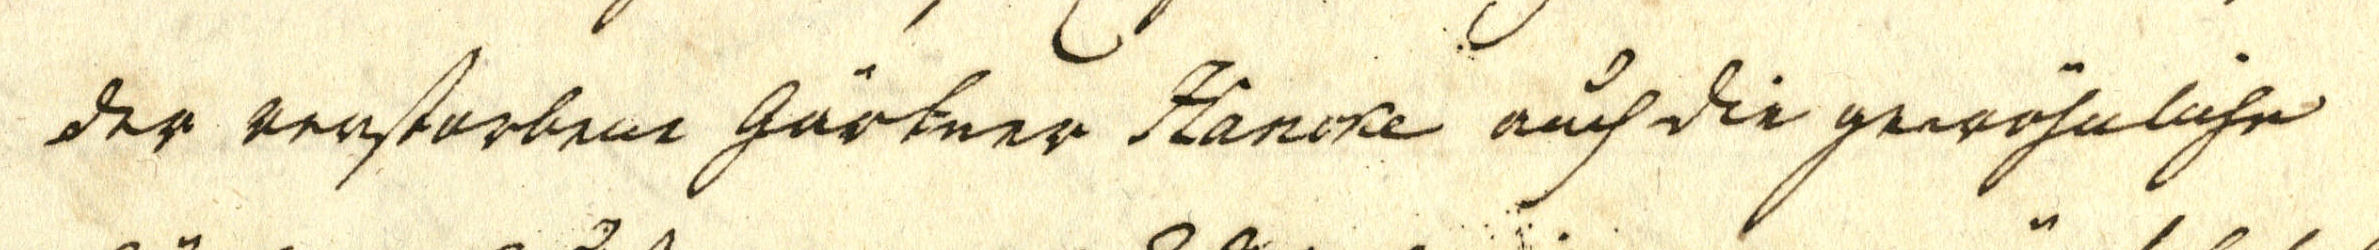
der verstorbene Gärtner Hancke auch die gewöhnliche
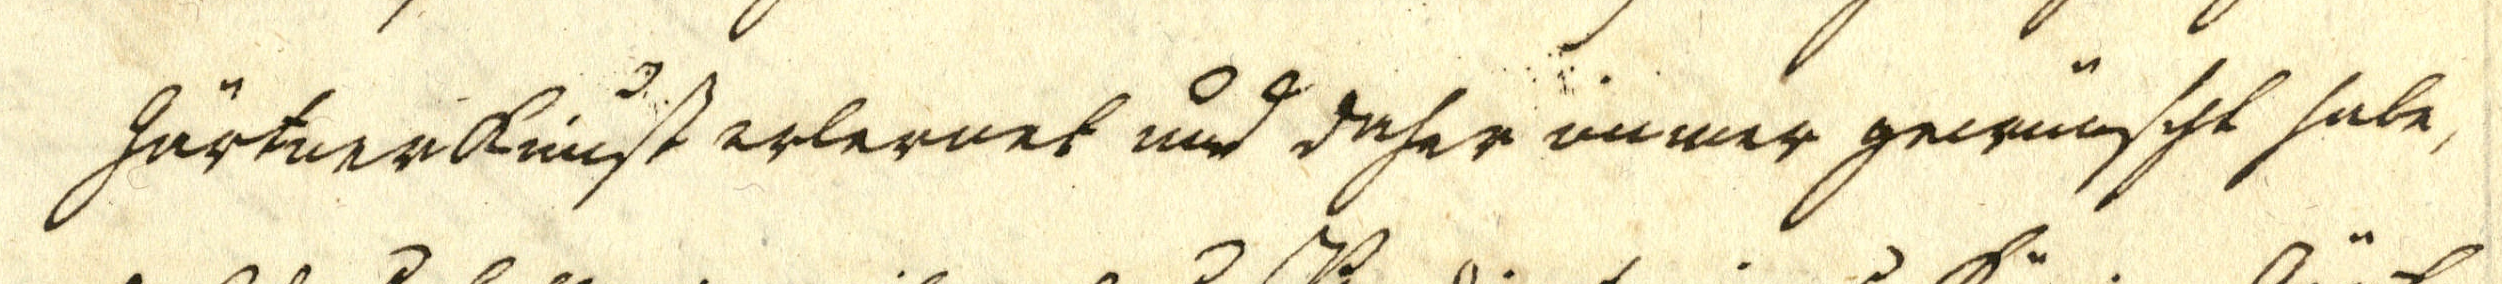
Gärtnerkunist erlernet und daher immer gewünscht habe,
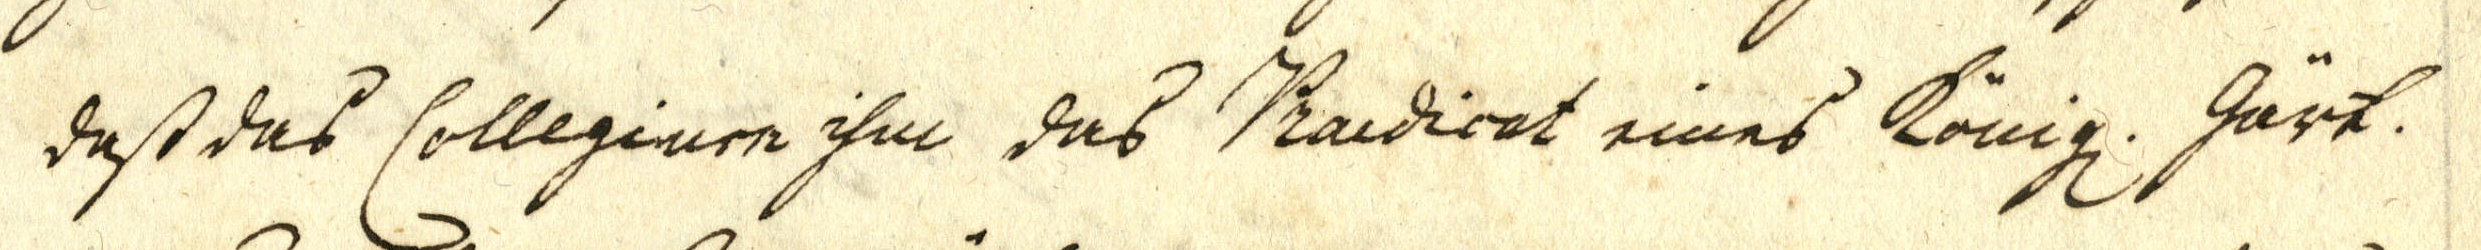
daß das Collegium ihm das Praedicat eines Königl. Gärt¬
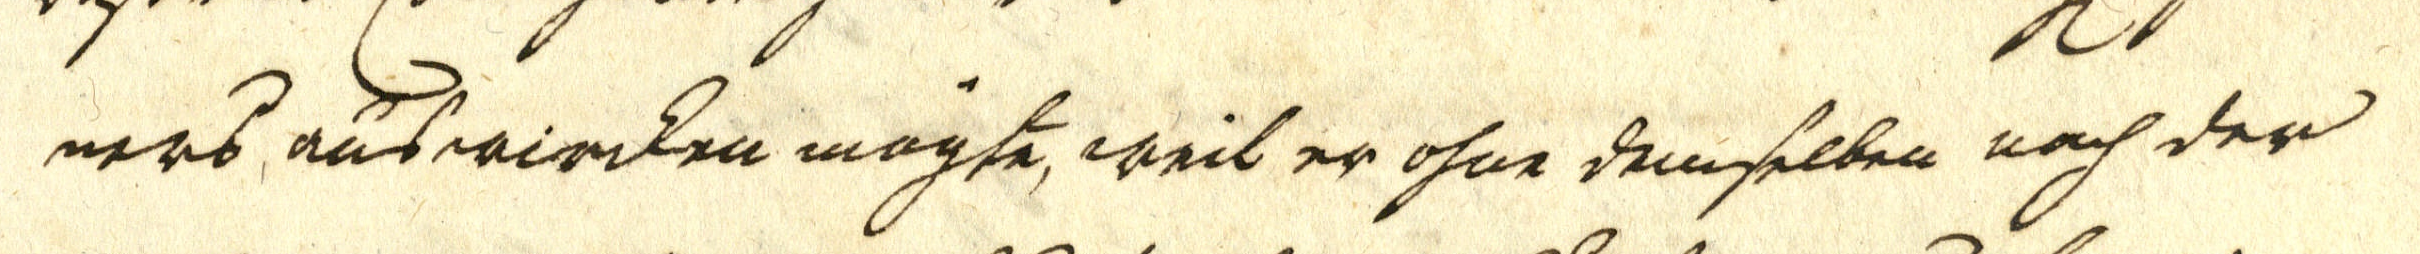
ners auswircken mögte, weil er ohne demselben nach der
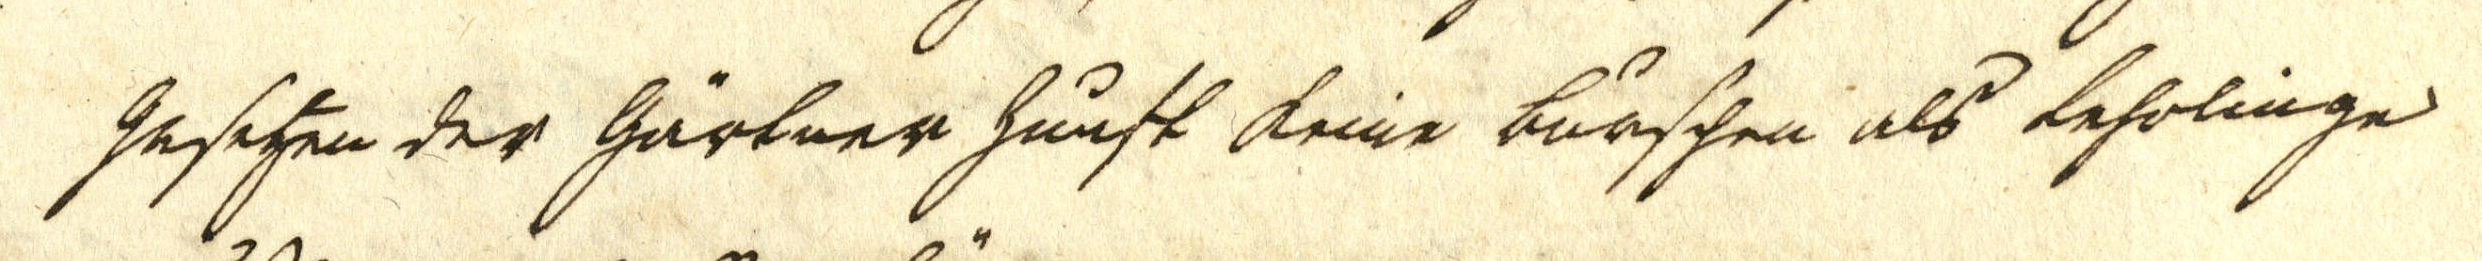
Gesetzen der Gärtner Zunft keine Buörschen als Lehrlinge
